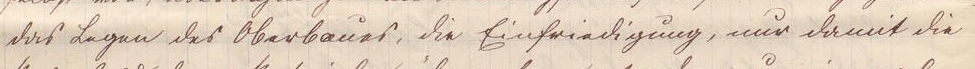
das Legen des Oberbaues, die Einfriedigung, nur damit die
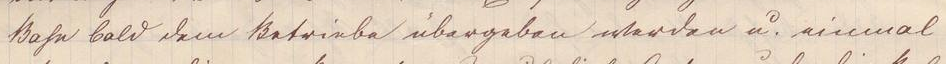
Bahn bald dem Betriebe übergeben werden u. einmal
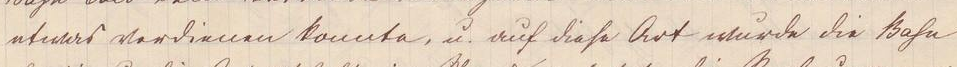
etwas verdienen konnte, u. auf diese Art wurde die Bahn
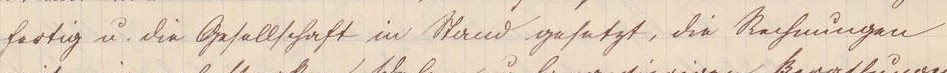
fertig u. die Gesellschaft in Stand gesetzt, die Rechnungen
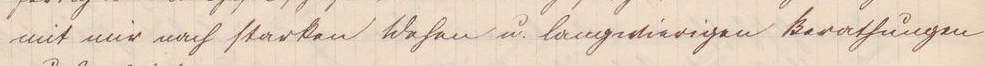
mit mir nach starken Wehen u. langwierigen Berathungen
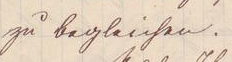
zu begleichen.
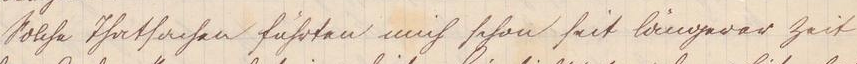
Solche Thatsachen führten mich schon seit längerer Zeit
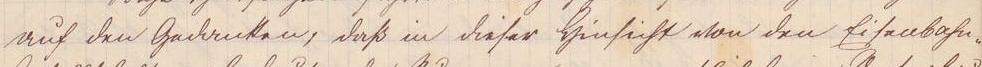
auf den Gedanken, daß in dieser Hinsicht von den Eisenbahn-
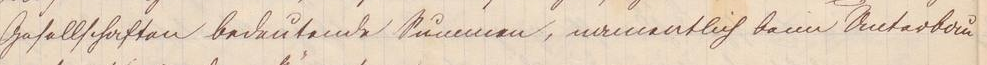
Gesellschaften bedeutende Summen, namentlich beim Unterbau,
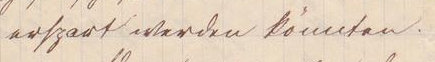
erspart werden könnten.
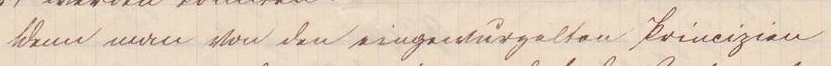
Wenn man von den eingewurzelten Principien
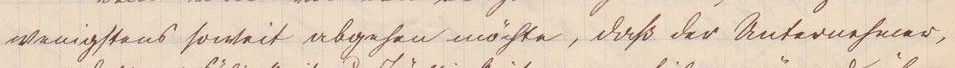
wenigstens soweit abgehen möchte, daß der Unternehmer,
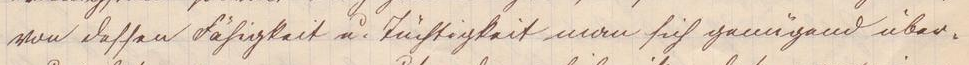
von dessen Fähigkeit u. Tüchtigkeit man sich genügend über-
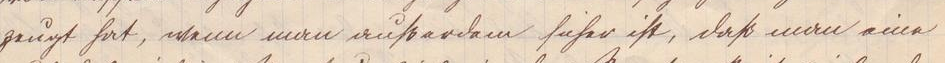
zeugt hat, wenn man außerdem sicher ist, daß man eine
